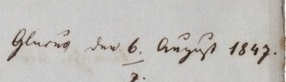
Glarus den 6./7. August 1847.
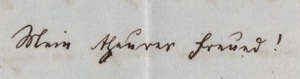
Mein theurer Freund!
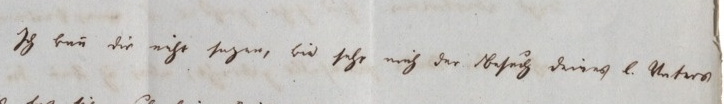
Ich kann Dir nicht sagen, wie sehr mich der Besuch Deines l. Vaters
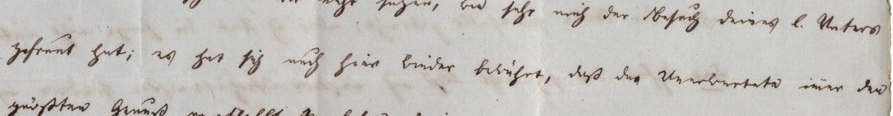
gefreut hat; es hat sich auch hier wieder bewährt, daß das Unerwartete immer den
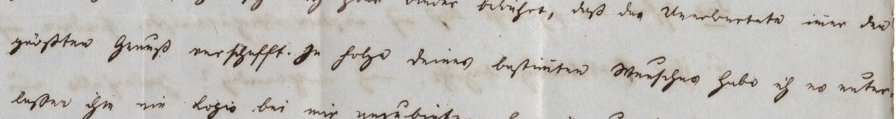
größten Genuß verschafft. In Folge Deines bestimmten Wunsches habe ich es unter-
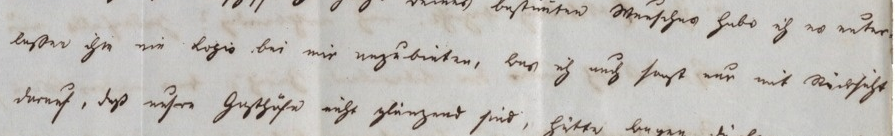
lassen ihm ein Logis bei mir anzubieten, was ich auch sonst nur mit Rücksicht
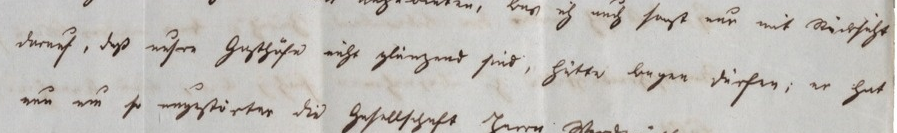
darauf, daß unsre Gasthöfe nicht glänzend sind, hätte wagen dürfen; er hat
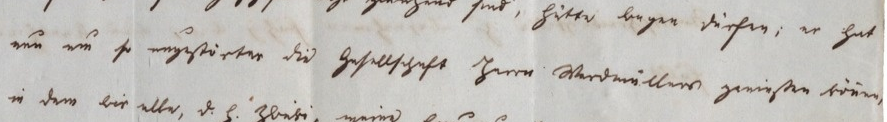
nun um so ungestörter die Gesellschaft Herrn Werdmüllers genießen können,
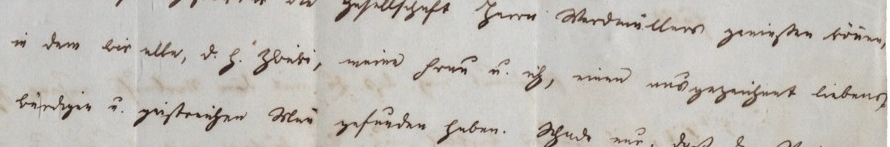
in dem wir alle, d. h. Zwicki, meine Frau u. ich, einen ausgezeichnet liebens-
